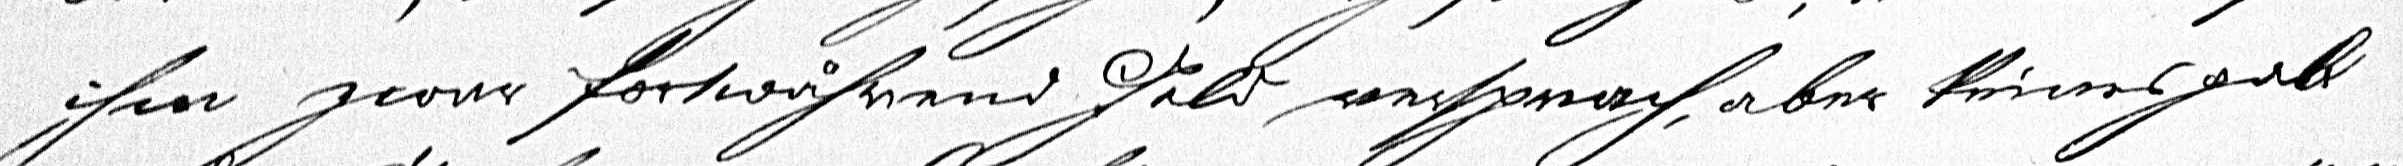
ihm zwar fortwährend Geld versprach, aber keines gab.
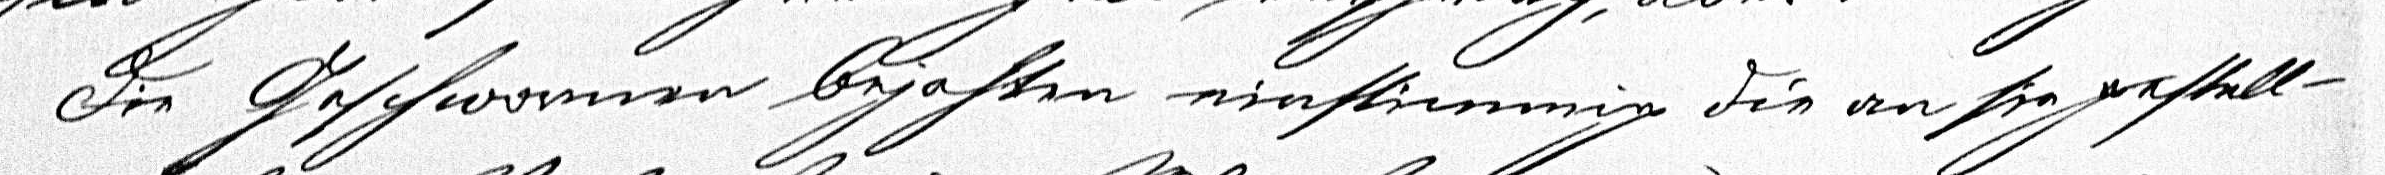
Die Geschworenen bejahten einstimmig die an sie gestell¬
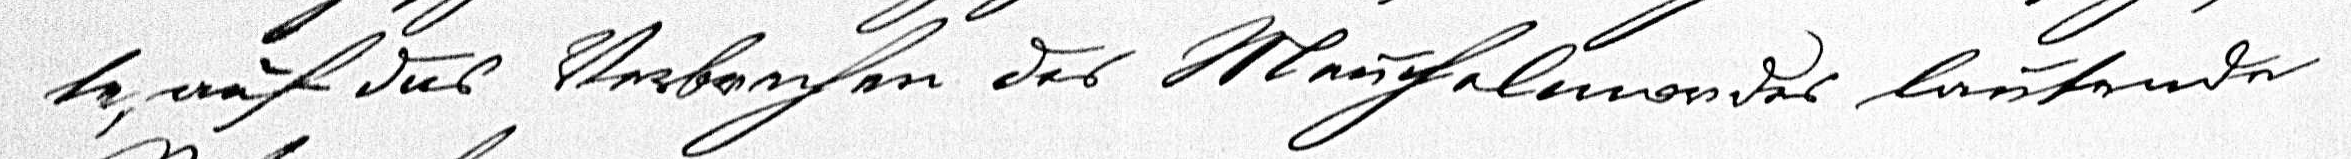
te, auf das Verbrechen des Meuchelmordes lautende
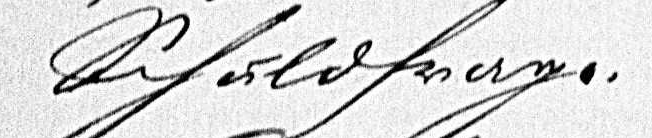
Schuldfrage.
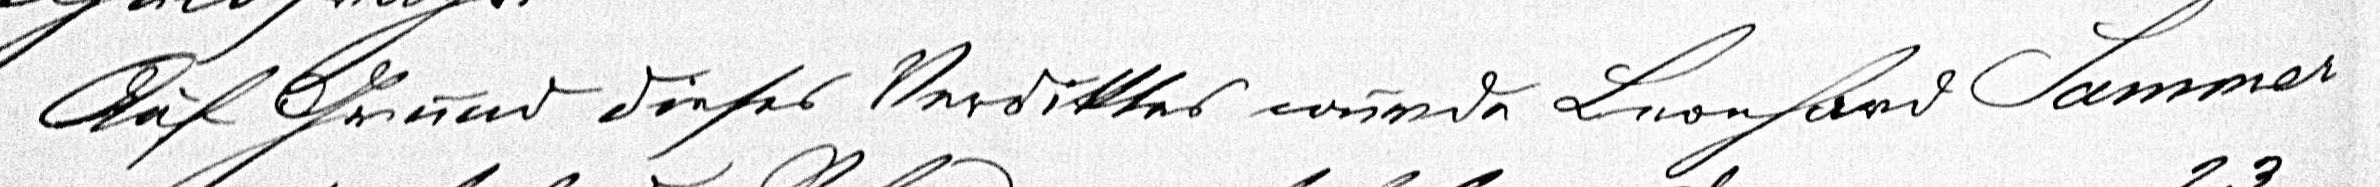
Auf Grund dieses Verdiktes wurde Leonhard Sammer
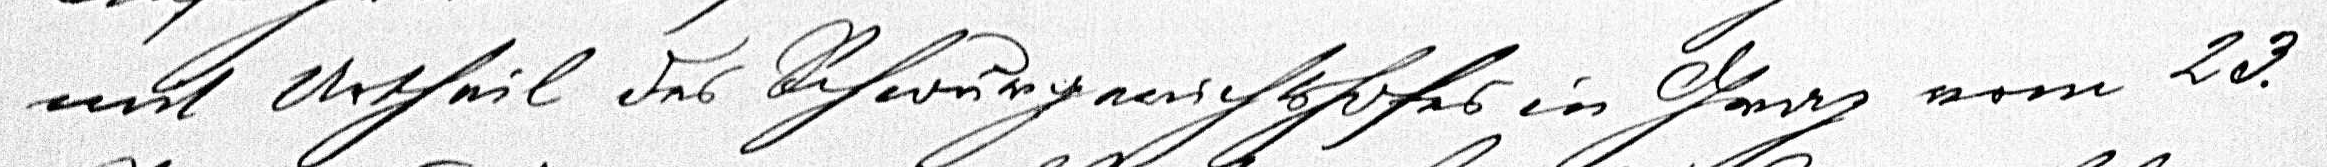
mit Urtheil des Schwurgerichtshofes in Graz vom 23.
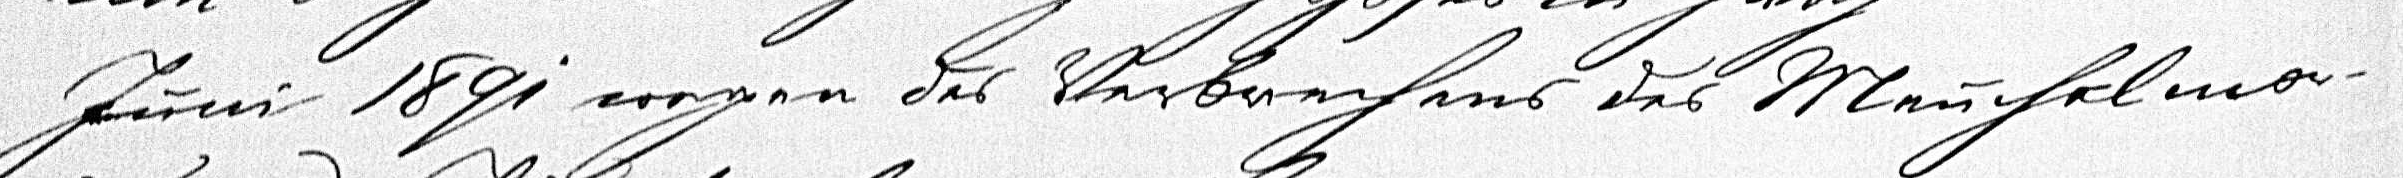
Juni 1891 wegen des Verbrechens des Meuchelmor¬
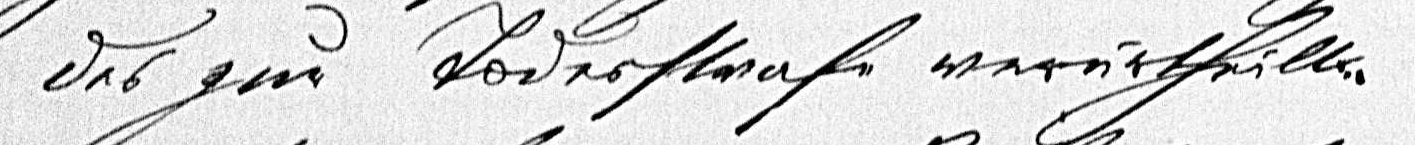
des zur Todesstrafe verurtheilte.
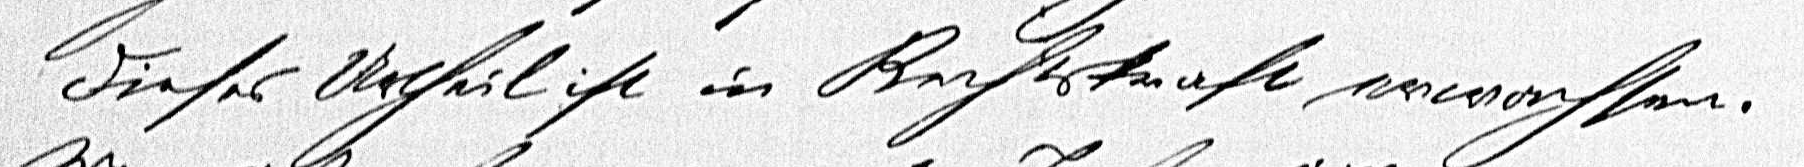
Diese Urtheil ist in Rechtskraft erwachsen.
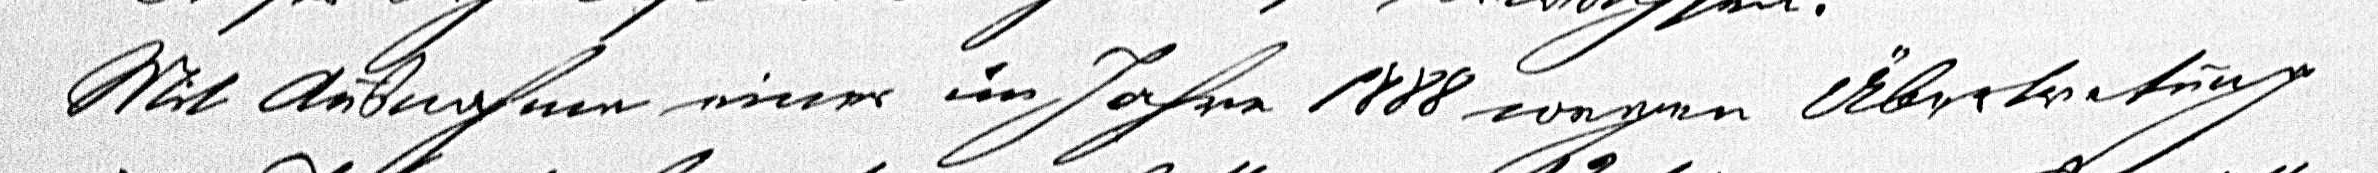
Mit Ausnahme einer im Jahre 1888 wegen Übertretung
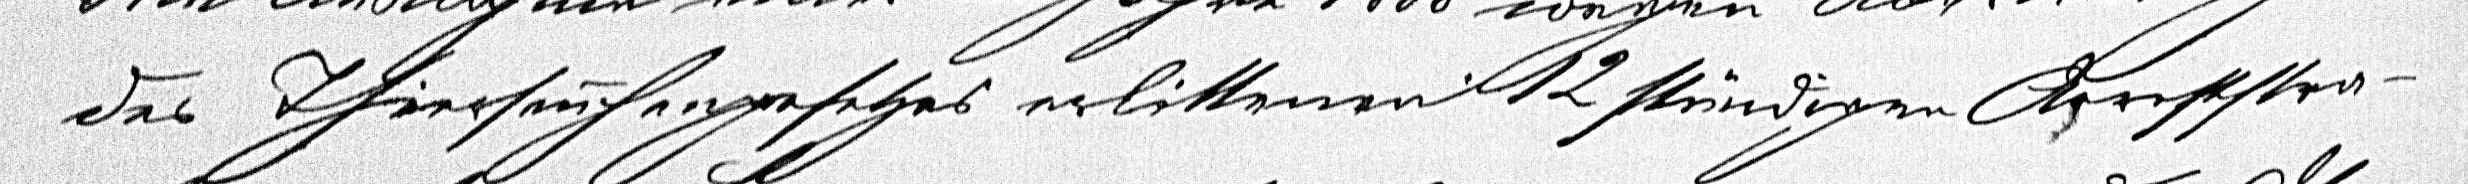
des Thierseucungsgesetzes erlittenen 12stündigen Arreststra¬
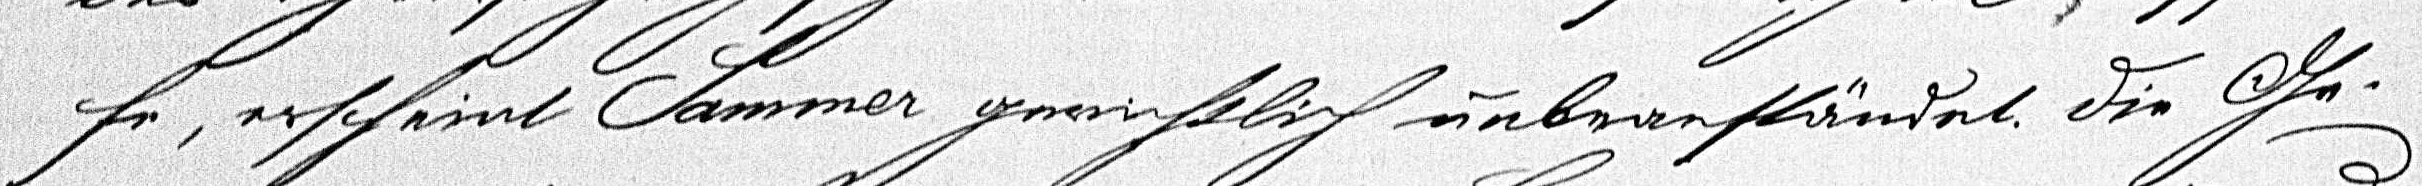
fe, erscheint Sammer gerichtlich unbeanständet. Die Ge¬
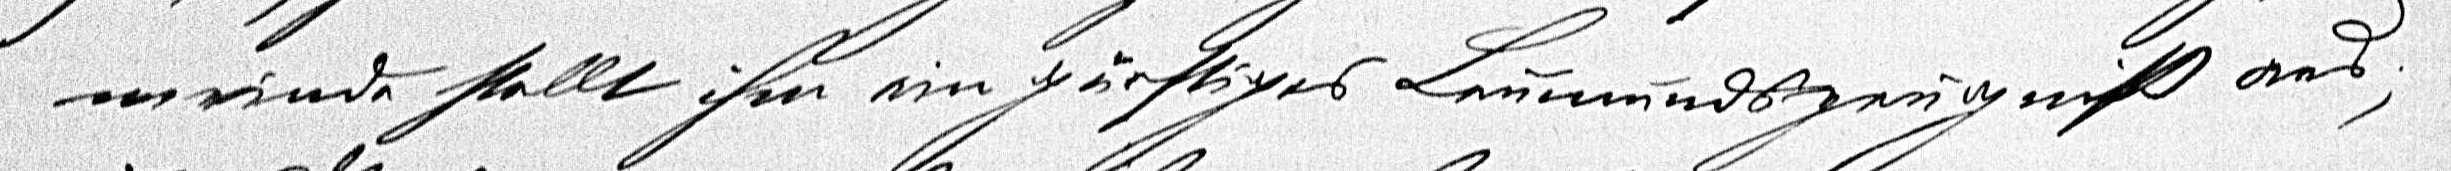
meinde stellt ihm ein günstiges Leumundszeugniß aus;
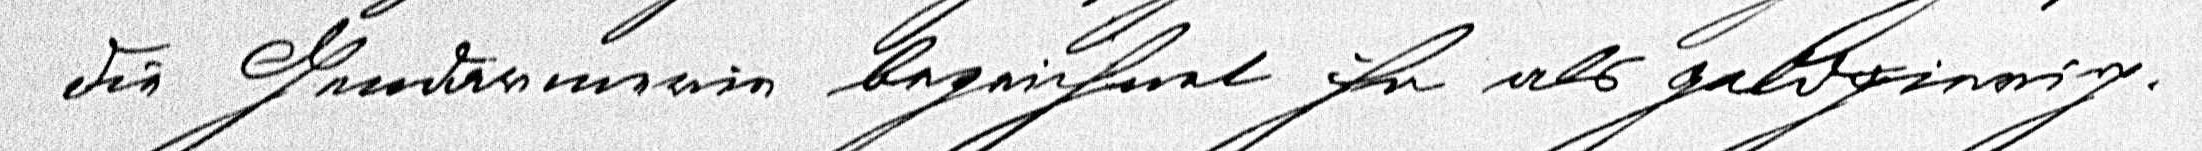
die Gendarmerie bezeichnet ihn als geldgierig.
